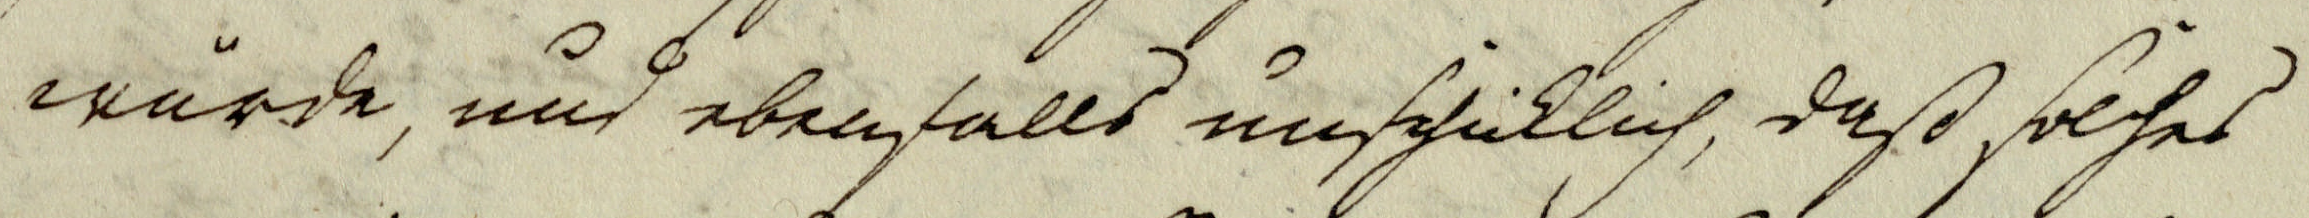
würde, und ebenfalls unschicklich, daß solches
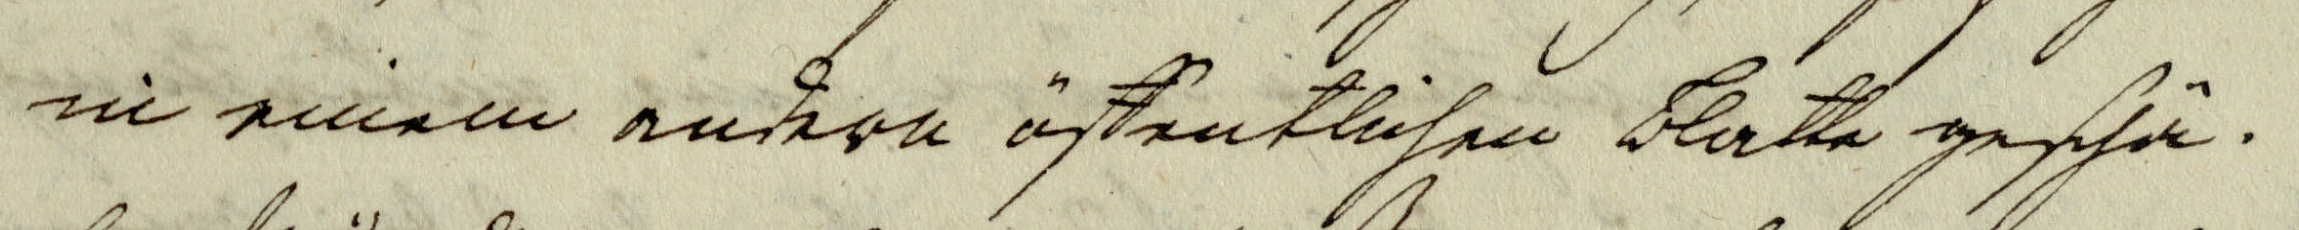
in einem andern öffentlichen Blatte geschä¬
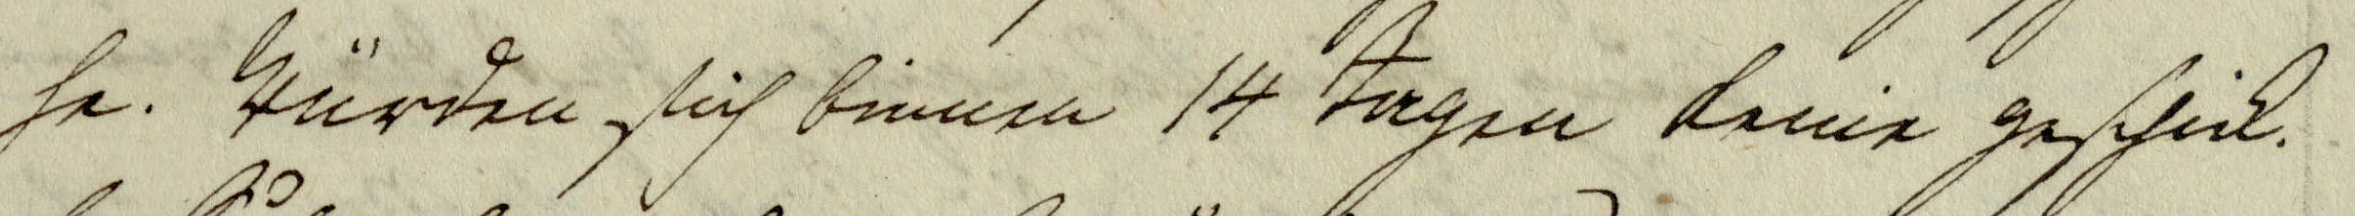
he. Würden sich binnen 14 Tagen keine geschick¬
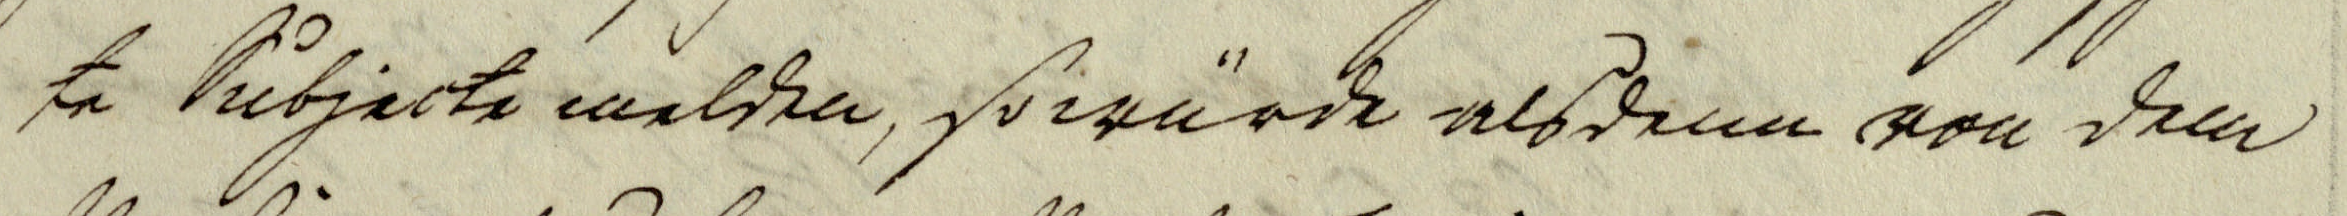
te Subjecte melden, so würde alsdann von dem
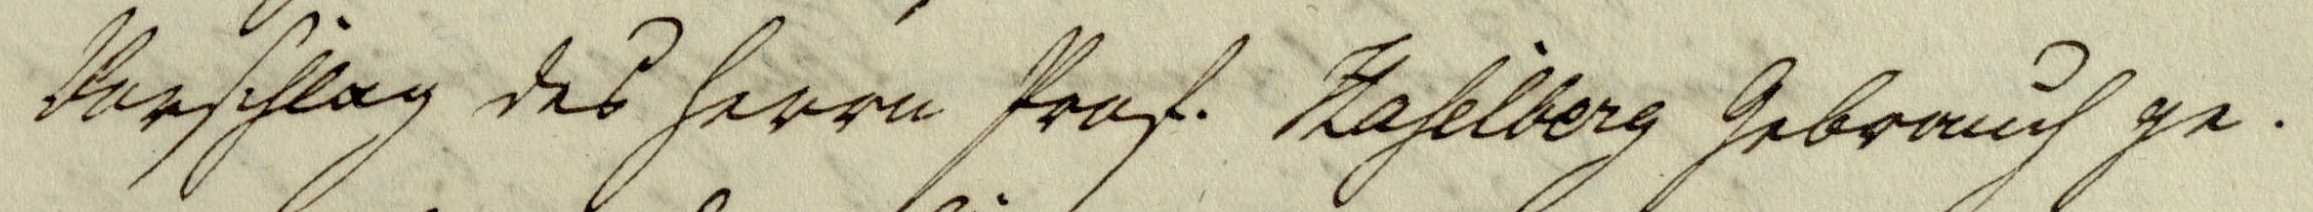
Vorschlag des Herrn Prof. Haselberg Gebrauch ge¬
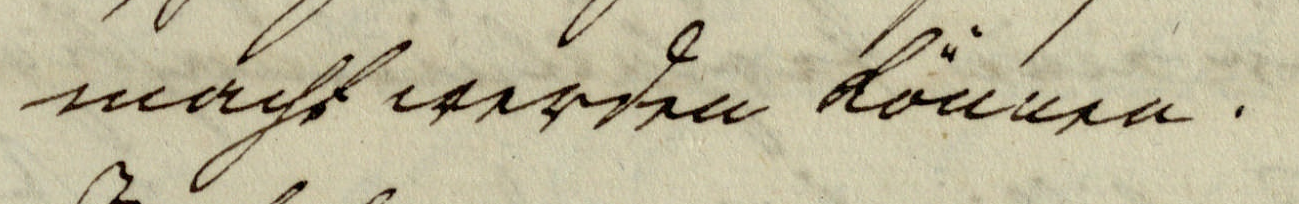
macht werden können.
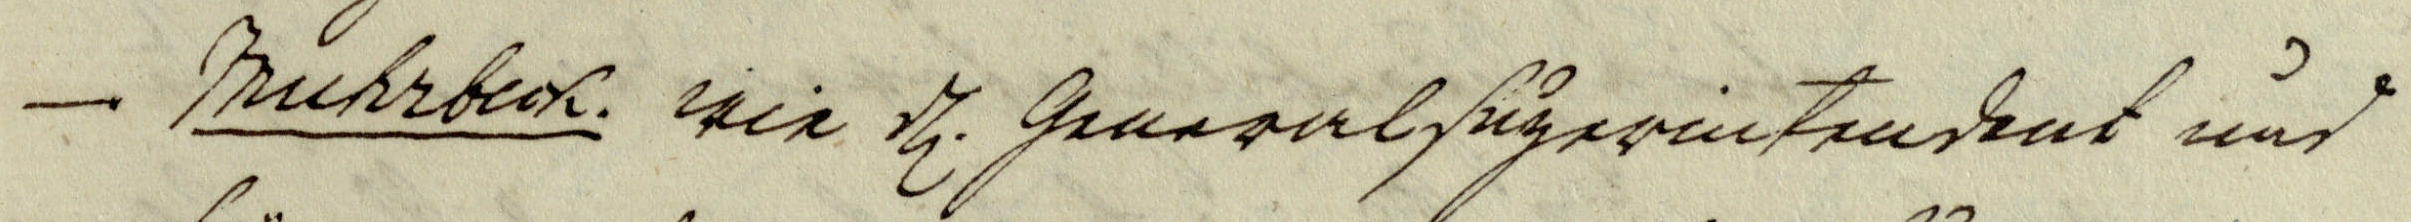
— . Muhrbeck. wie dh. Generalsuperintendent und
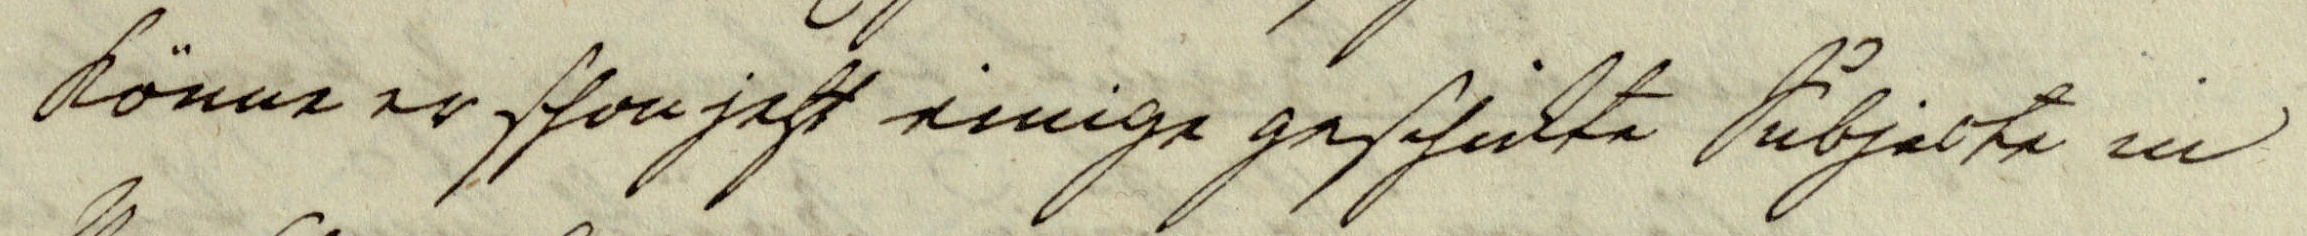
könne er schon jetzt einige geschickte Subjecte in
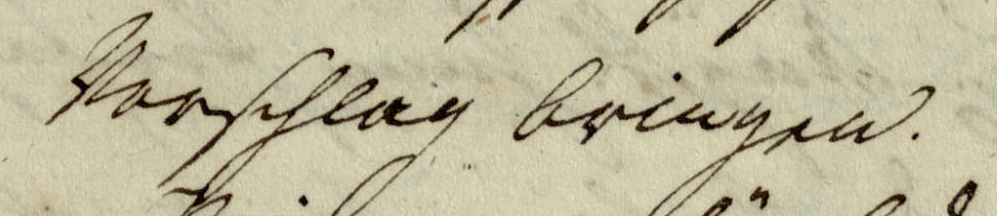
Vorschlag bringen.
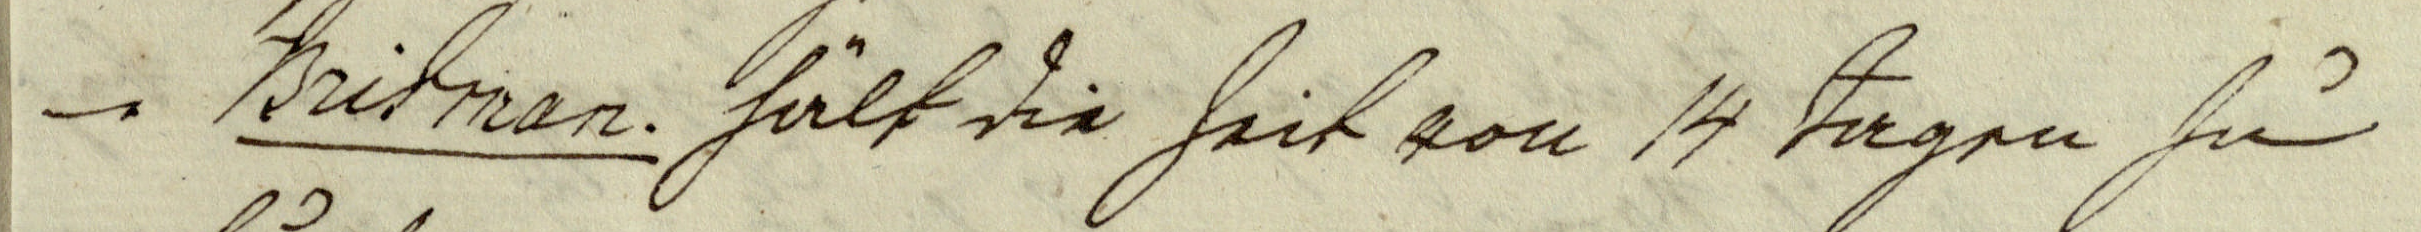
— . Brisman. Hält die Zeit von 14 Tagen zu
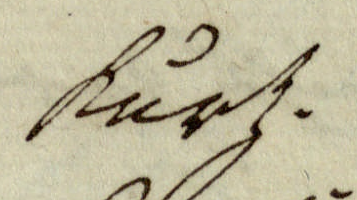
kurtz.
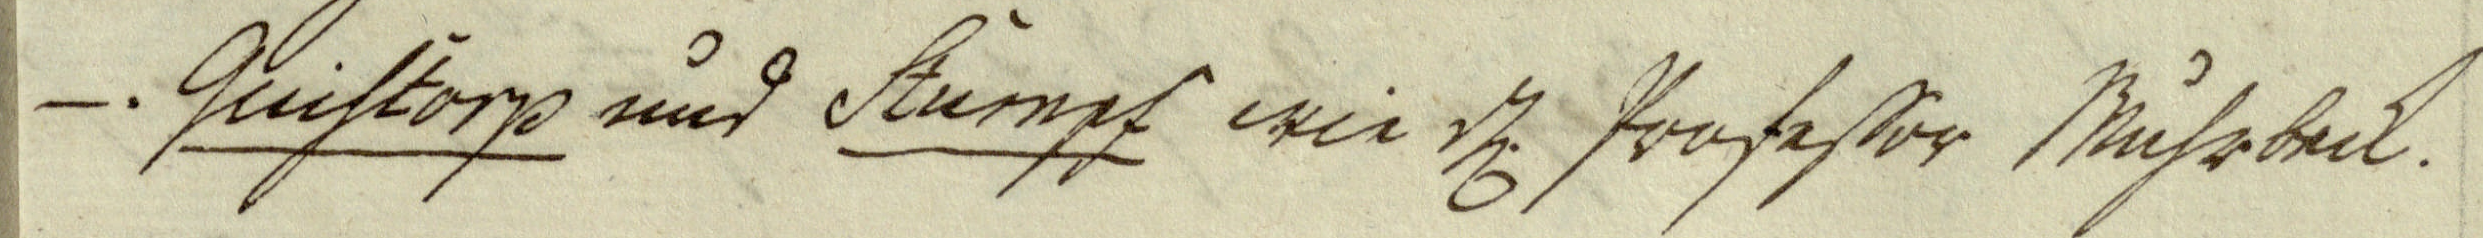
— . Quistorp und Stumpf wie dh. Prof. Muhrbeck.
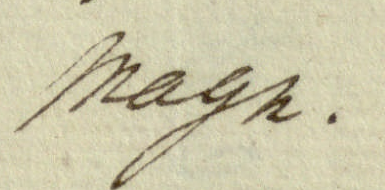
Magn.
